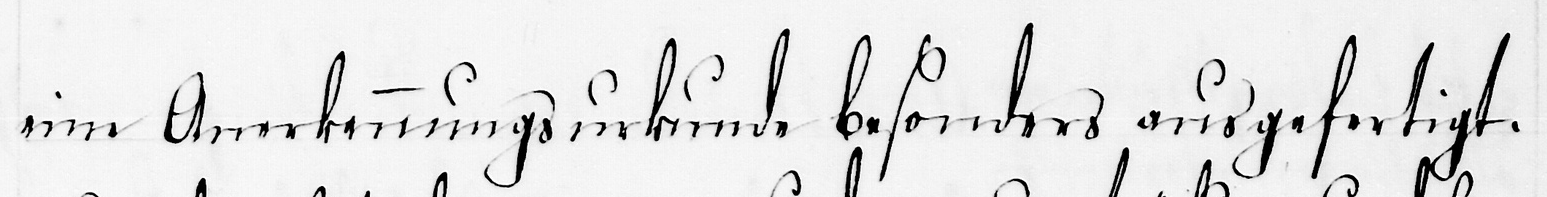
eine Anerkennungsurkunde besonders ausgefertigt.
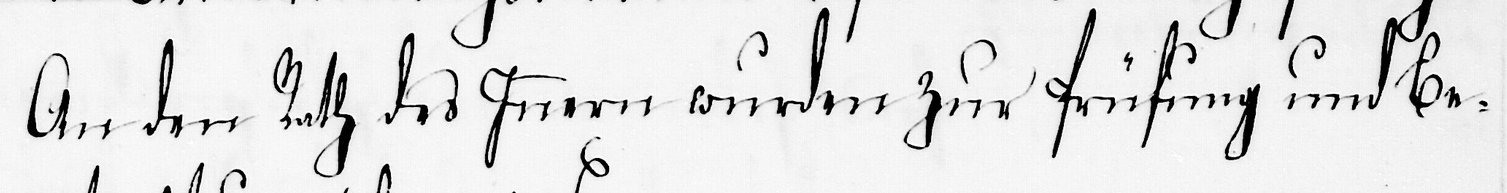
An den Rath des Innern wurden zur Prüfung und Be¬
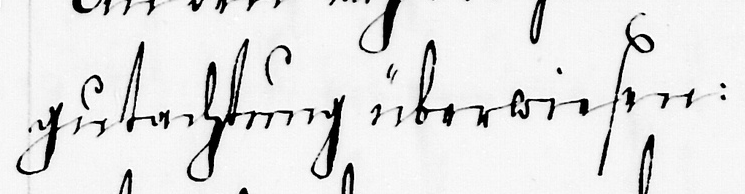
gutachtung überwiesen:
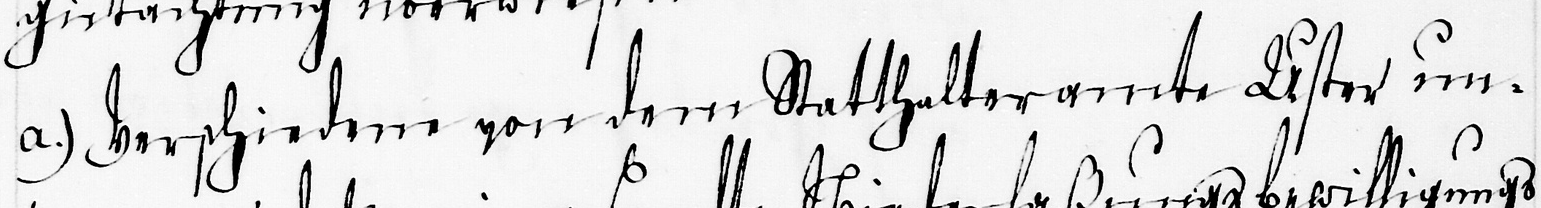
a.) Verschiedene von dem Statthalteramte Uster un¬
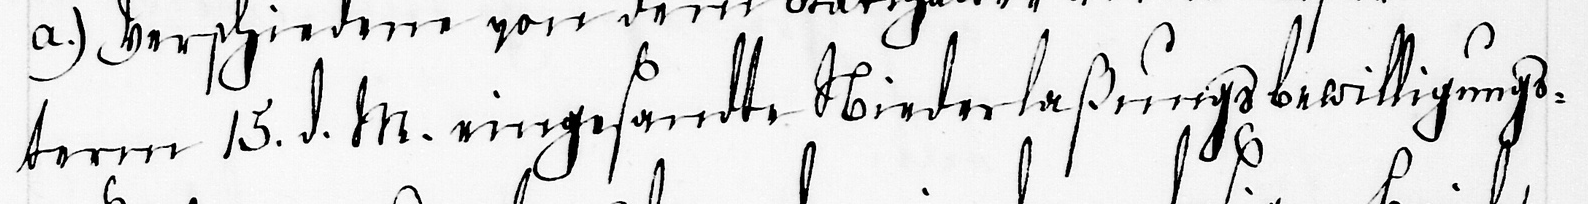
term 15. d. M. eingesandte Niederlaßungsbewilligungs¬
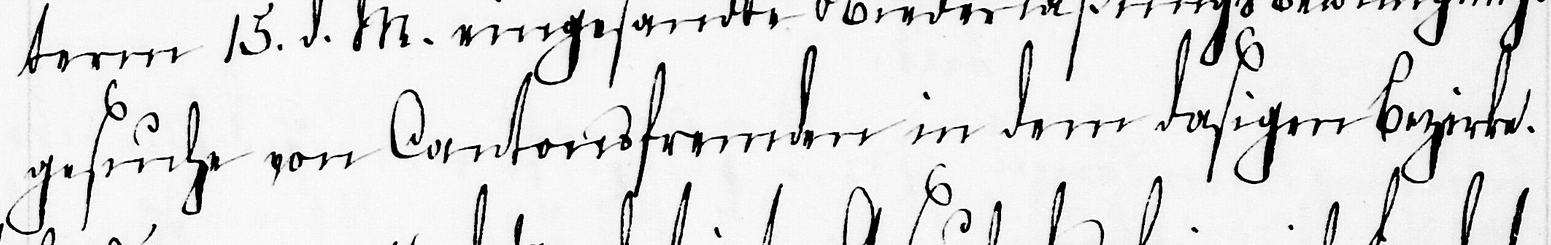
gesuche von Cantonsfremden in dem dasigen Bezirke.
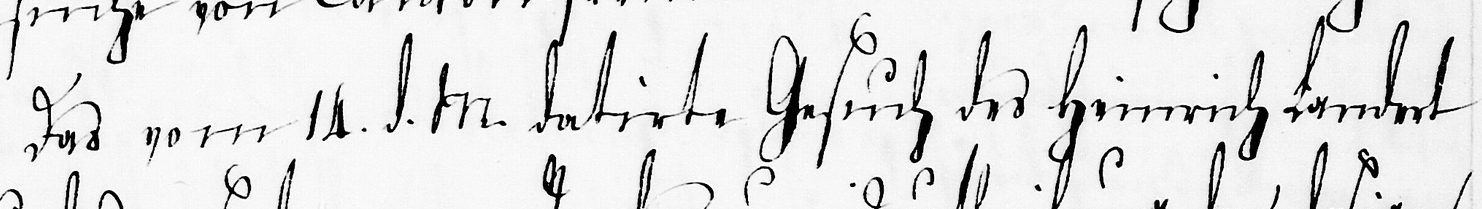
Das vom 14. d. M. datirte Gesuch des Heinrich Landert
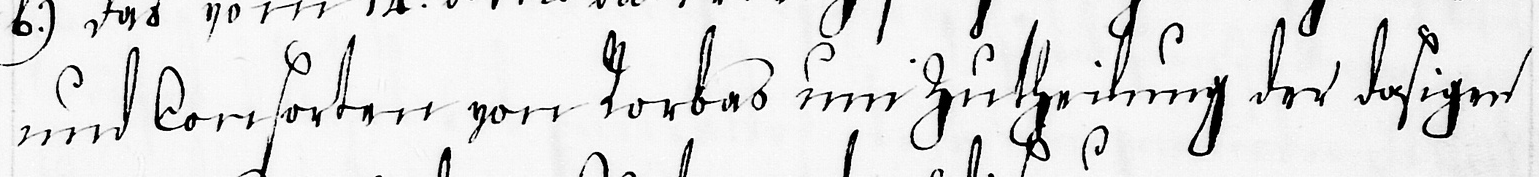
und Consorten von Rorbas um Zutheilung der dasigen
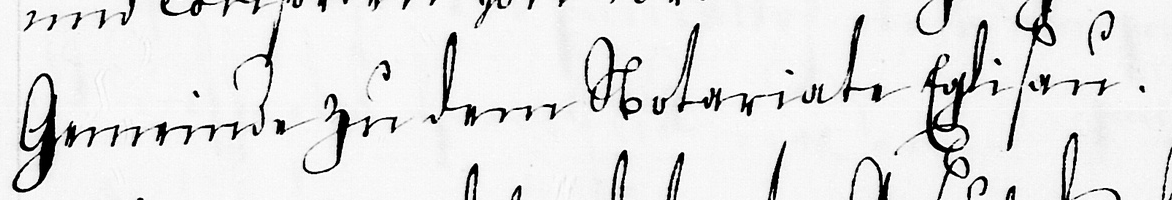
Gemeinde zu dem Notariate Eglisau.
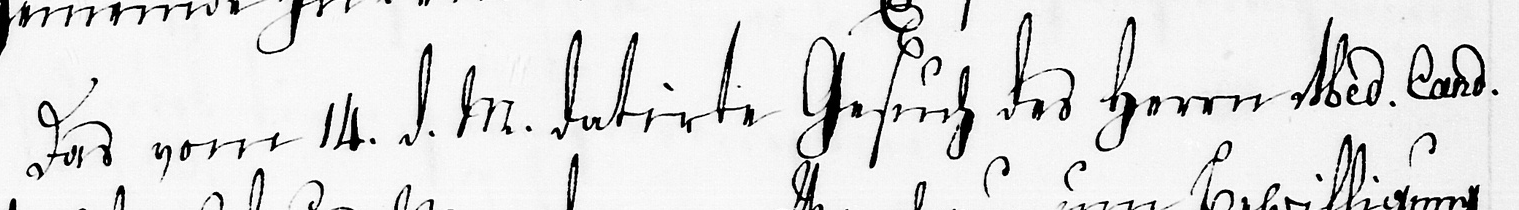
Das vom 14. d. M. datirte Gesuch des Herrn Med. Cand.
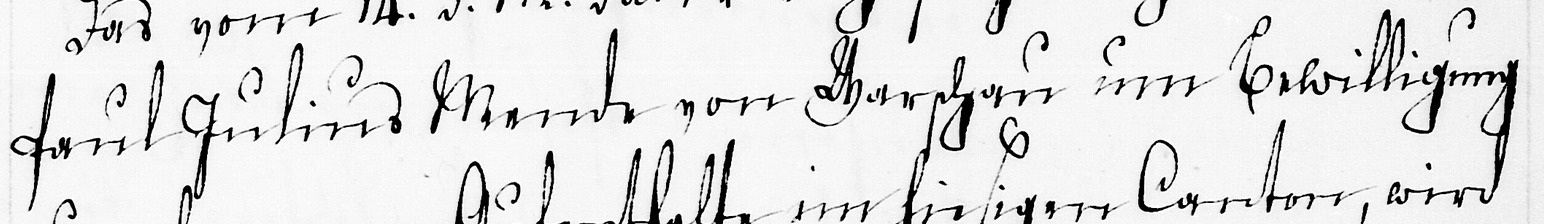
Paul Julius Mende von Warschau um Bewilligung
